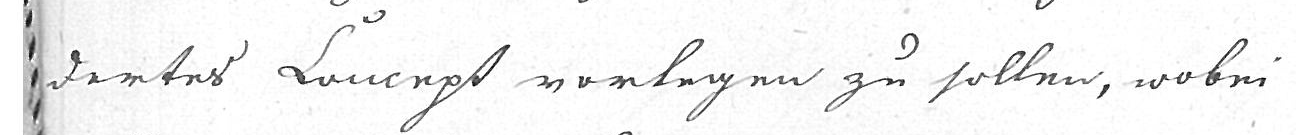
dertes Concept vorlegen zu sollen, wobei
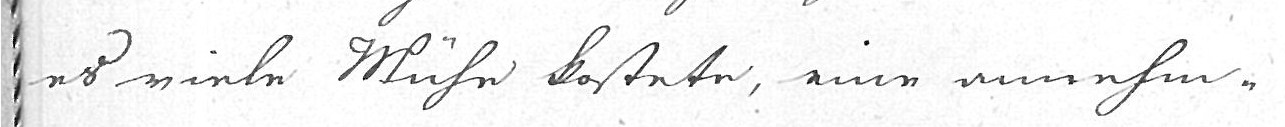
es viele Mühe Kostete, eine annehm-
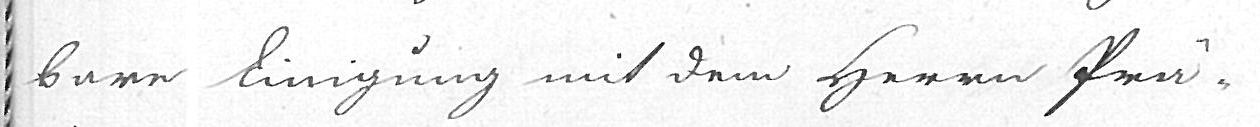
bare Eingigung mit dem Herrn Prä-
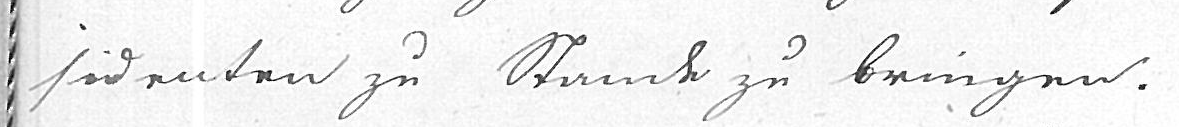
sidenten zu Stande zu bringen.
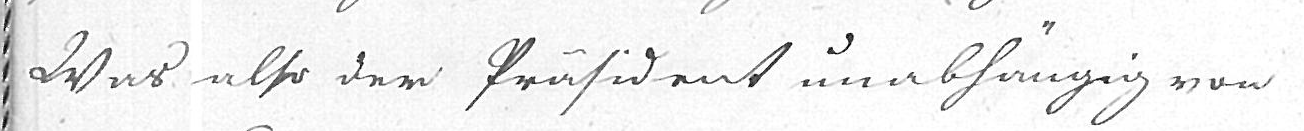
Was also der Präsident unabhängig von
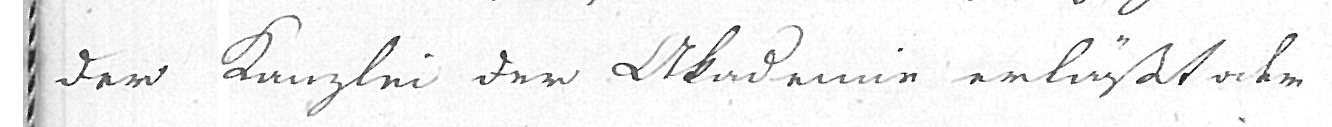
der Kanzlei der Akademie erläßt oder
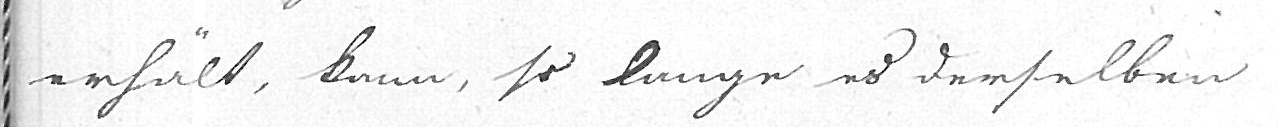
erhält, aknn so lange es derselben
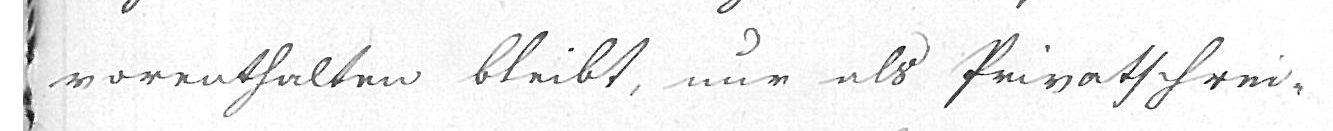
vorenthalten bleibt, nur als Privatschrei-
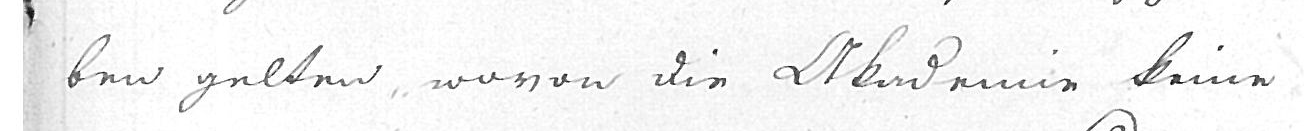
ben gelten, wovon die Akademie keine
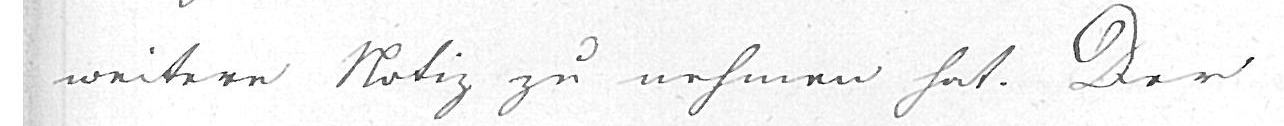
weitere Notiz zu nehmen hat. Der
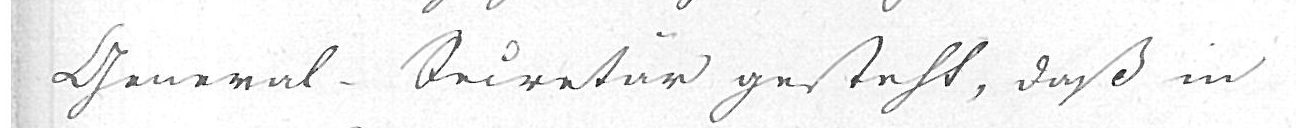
General-Secretär gesteht, daß in
